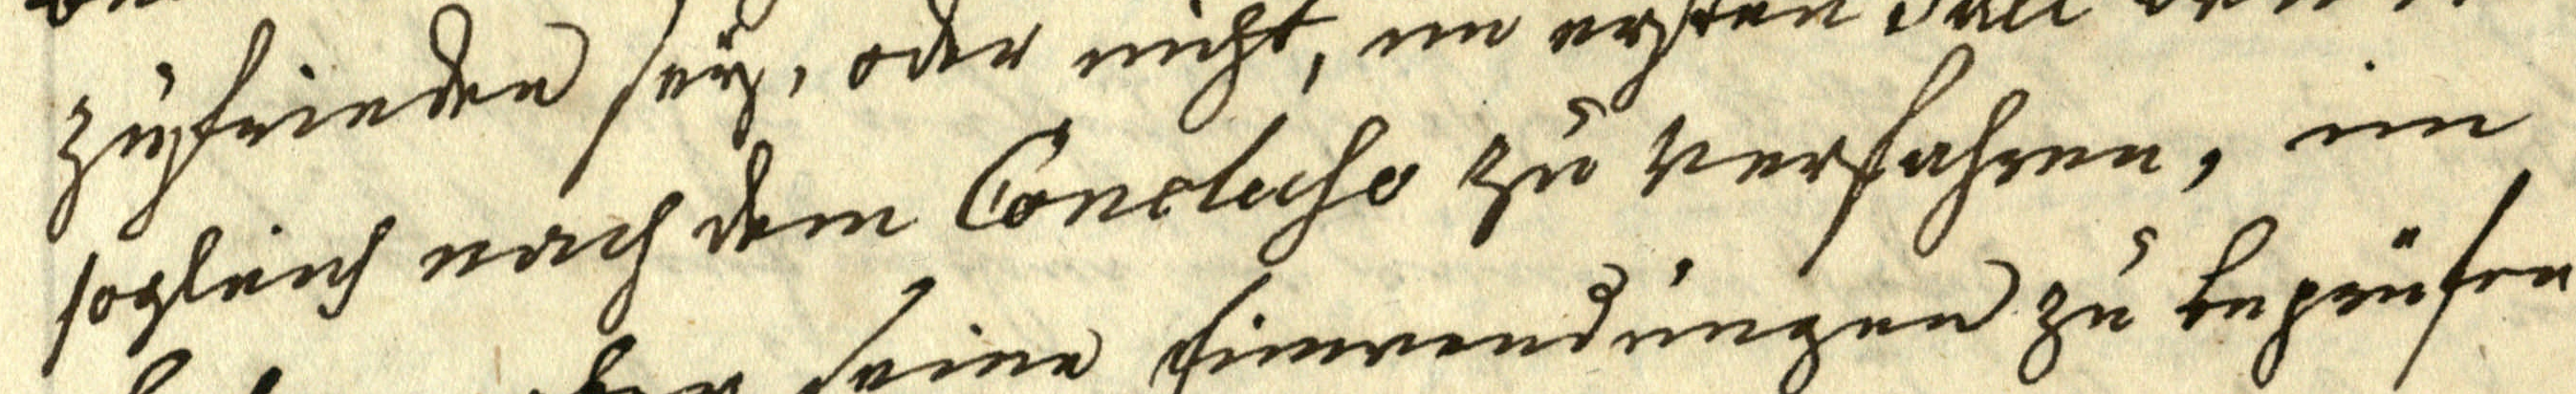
sogleich nach dem Concluso zu verfahren, im
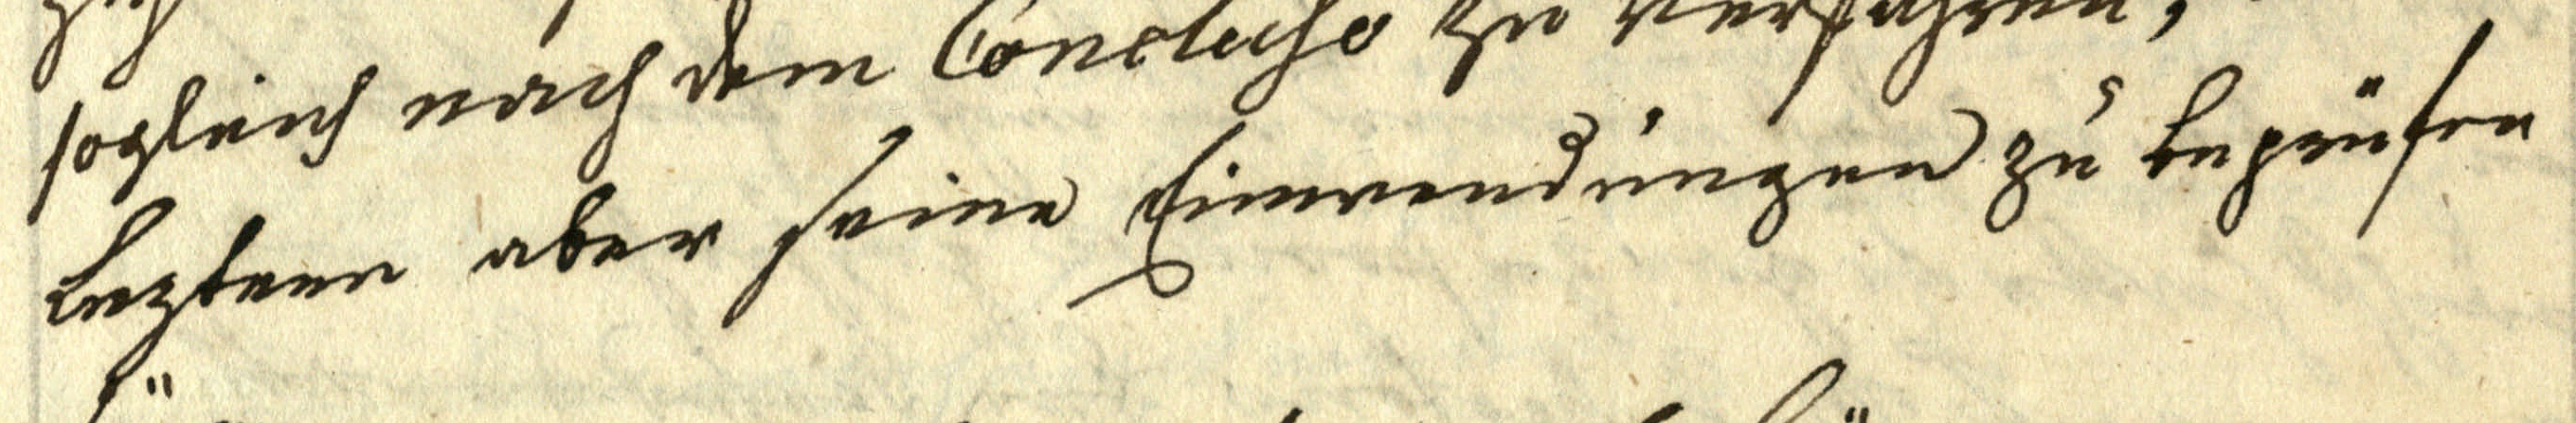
leztern aber seine Einwendungen zu beprüfen
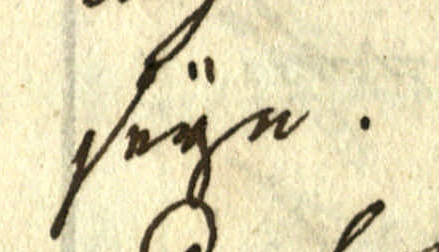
seÿn.
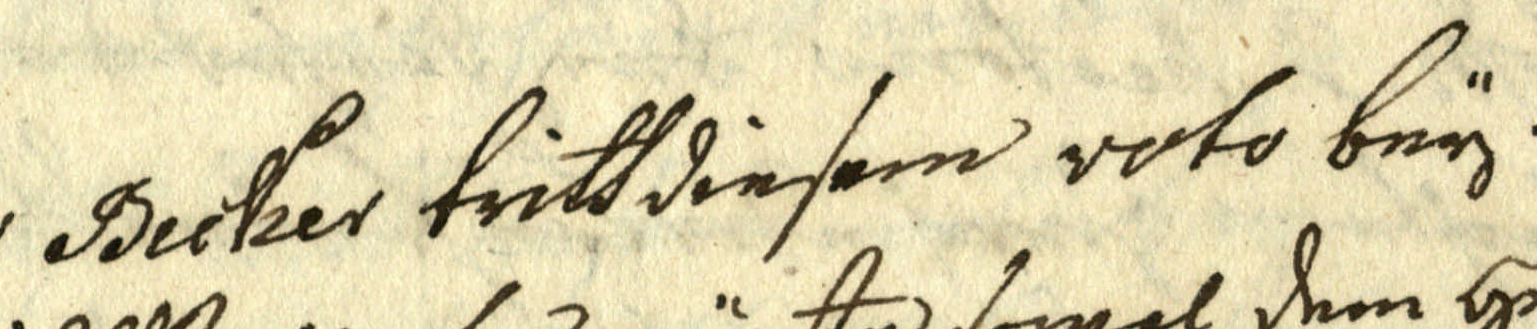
dh Professor Becker tritt diesem voto beÿ.
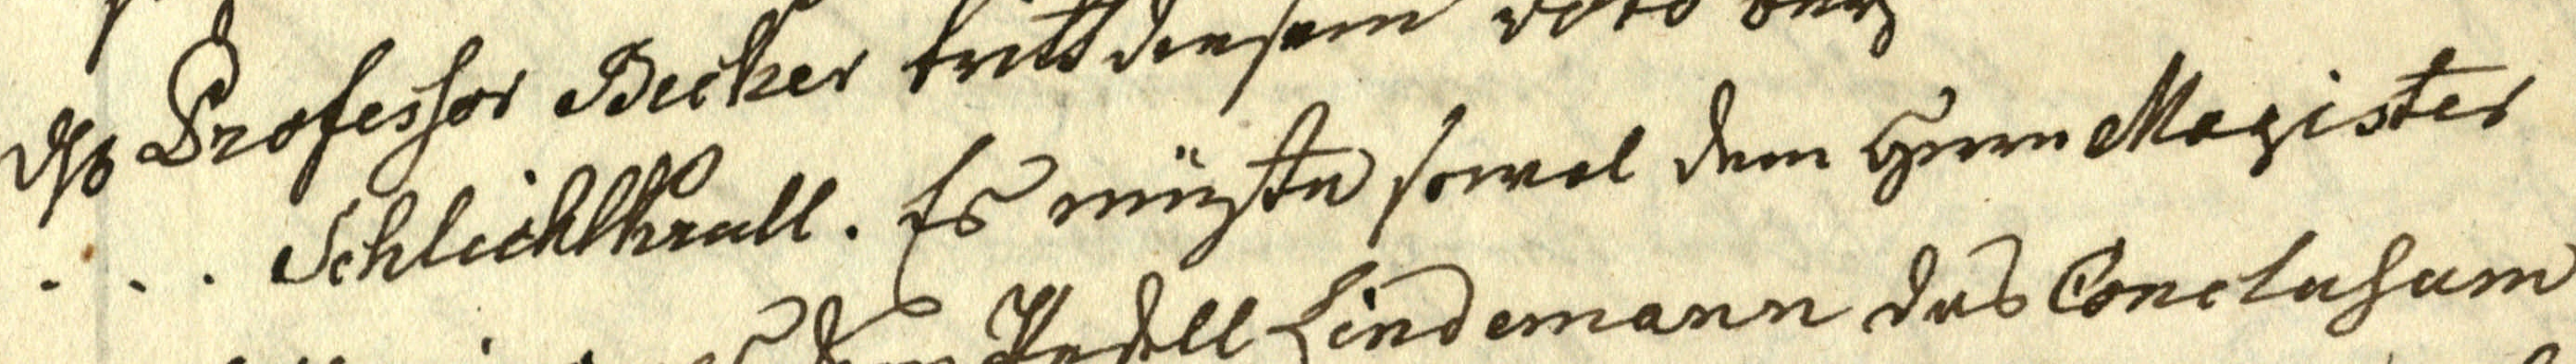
Schlichtkrull. Es müste sowol dem Herrn Magister
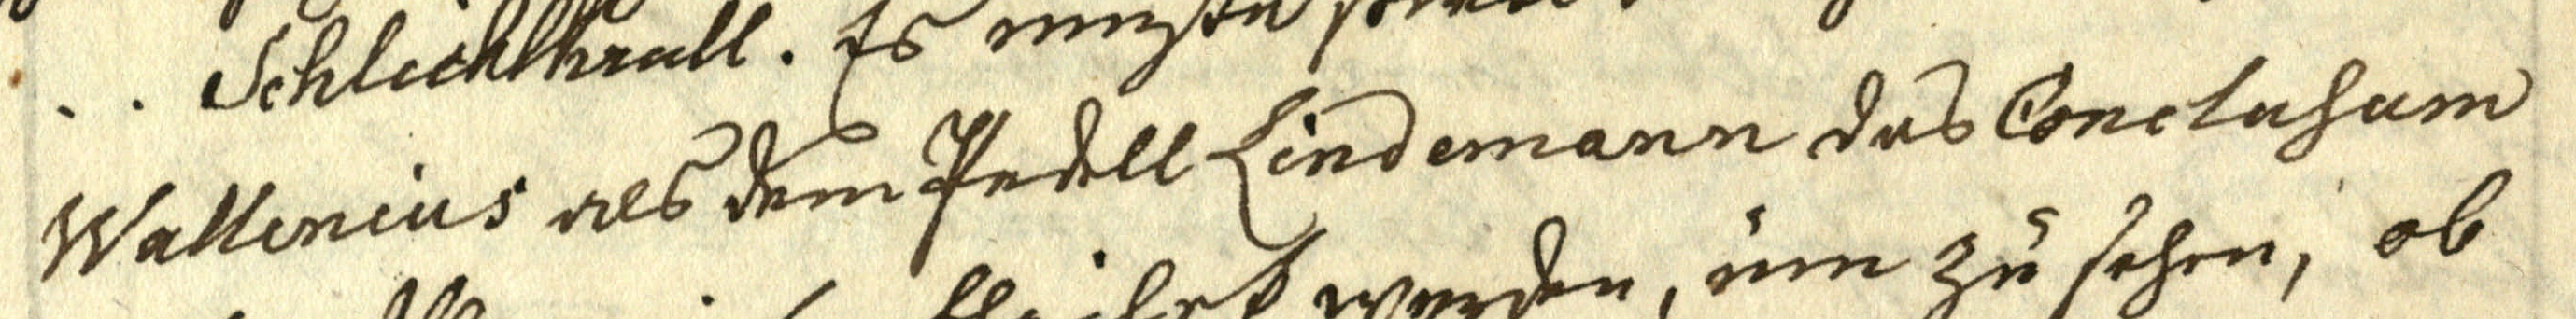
Wallenius als dem Pedell Lindemann das Conclusum
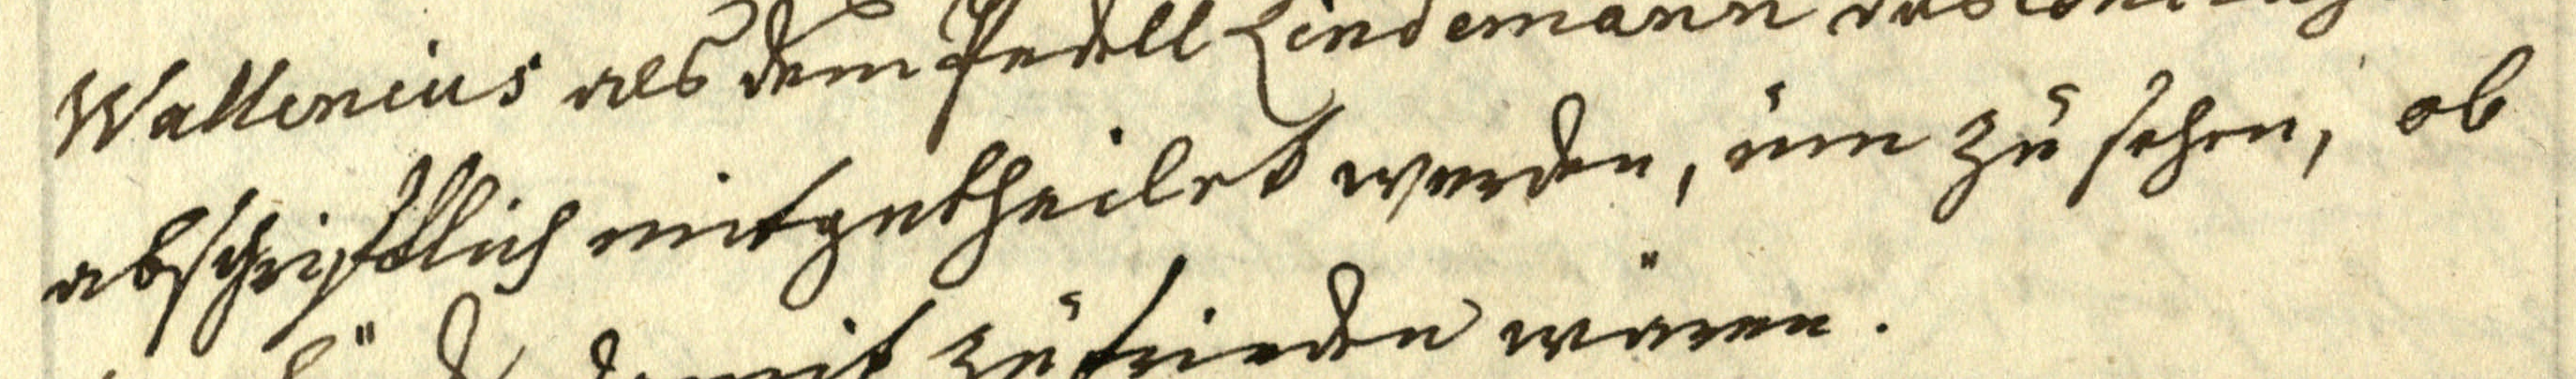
abschriftlich mitgetheilet werden, um zu sehen, ob
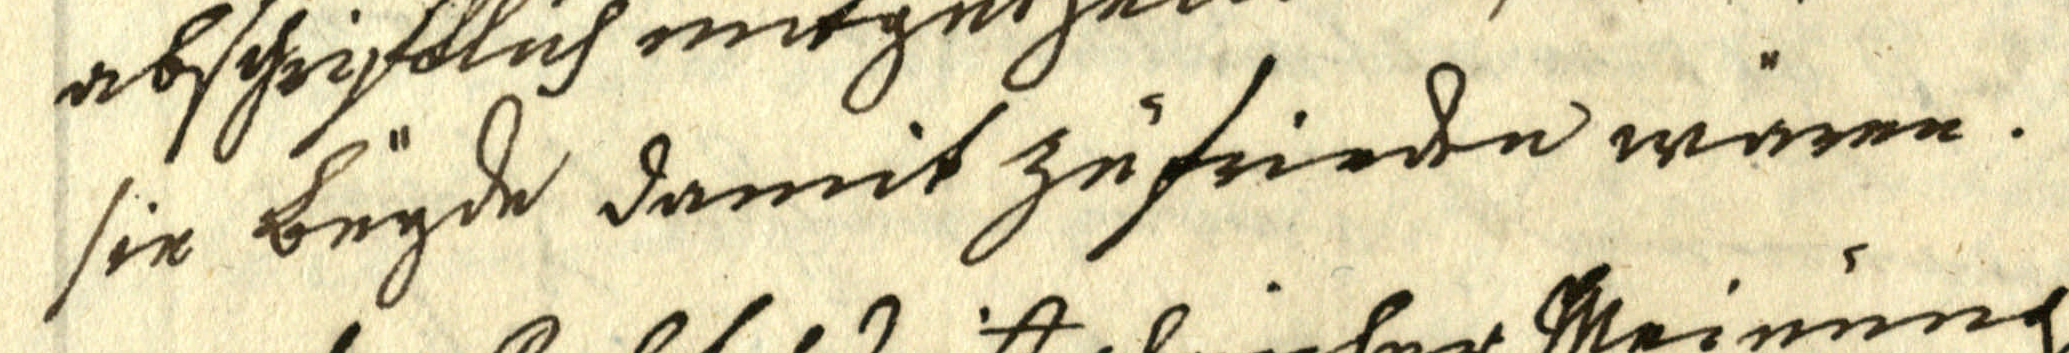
sie beÿde damit zufrieden wären.
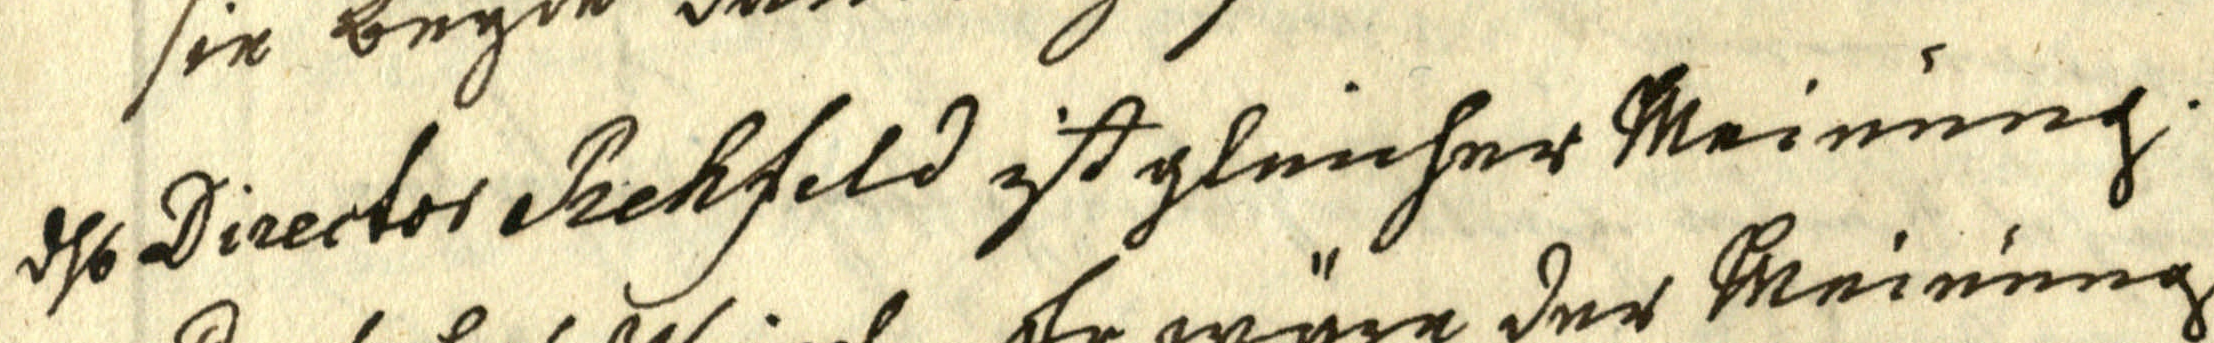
dh Director Rehfeld ist gleicher Meinung.
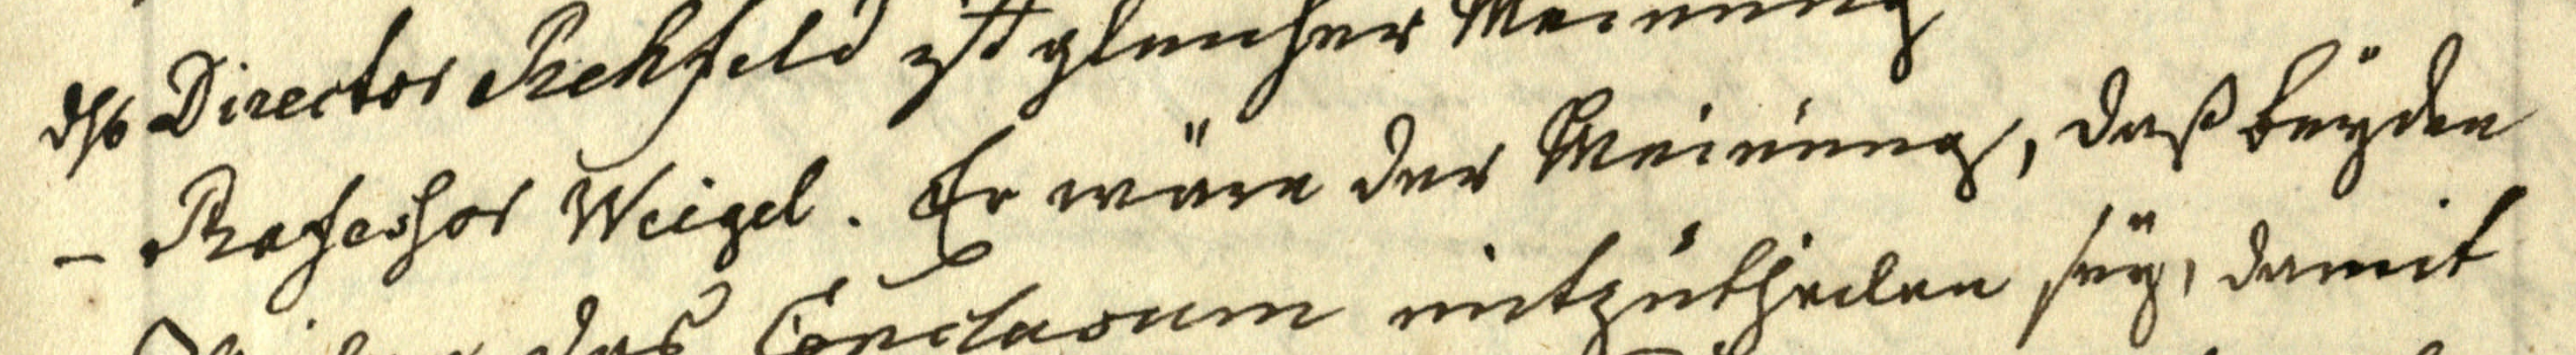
Professor Weigel. Er wäre der Meinung, daß beÿden
